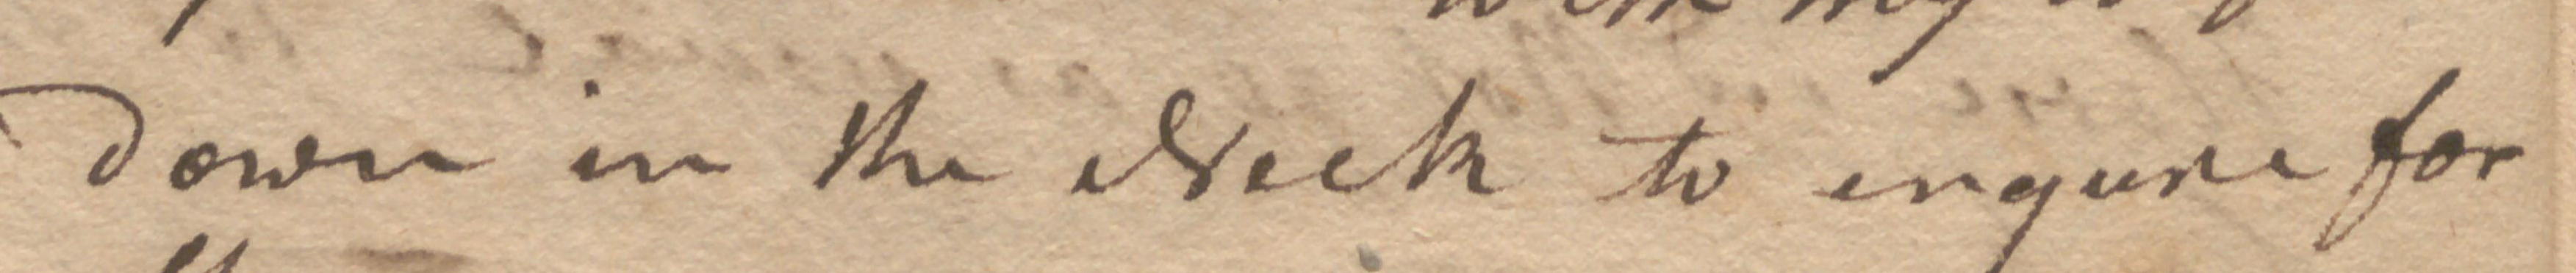down in the Neck to enqure for
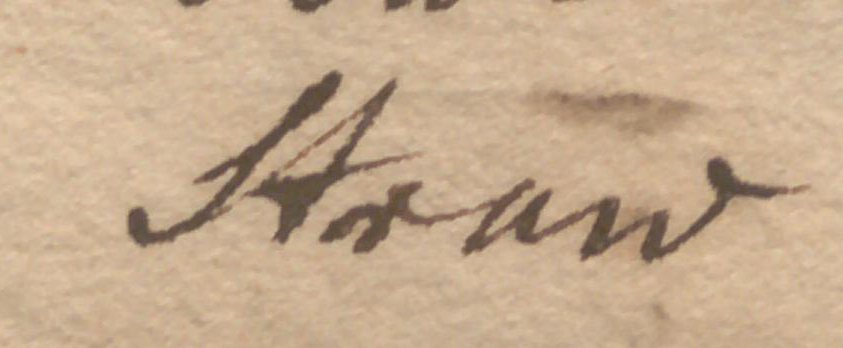Straw
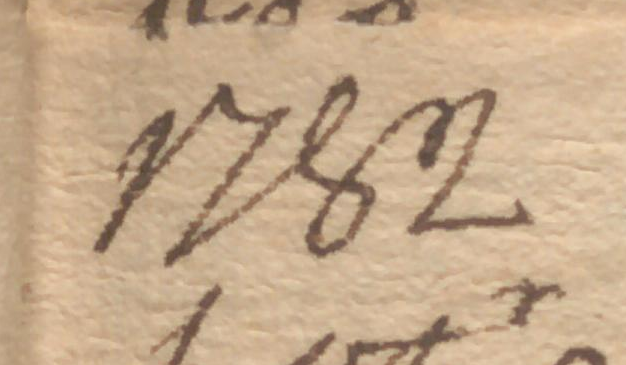1782
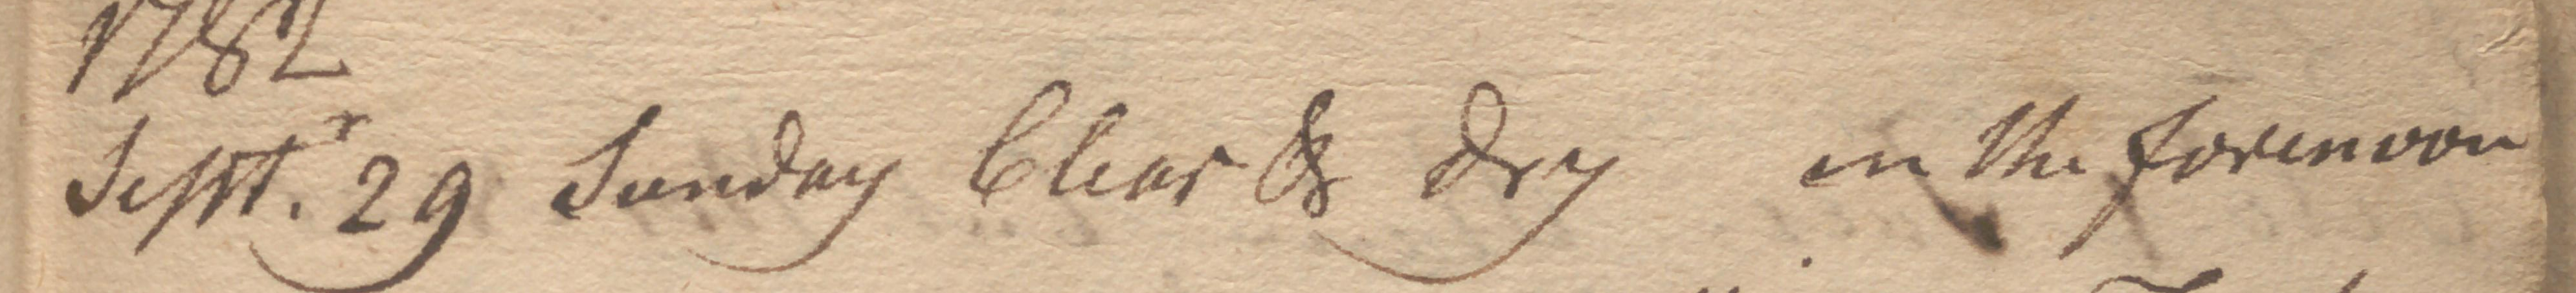Sept^r. 29 Sunday Clear & dry in the forenoon
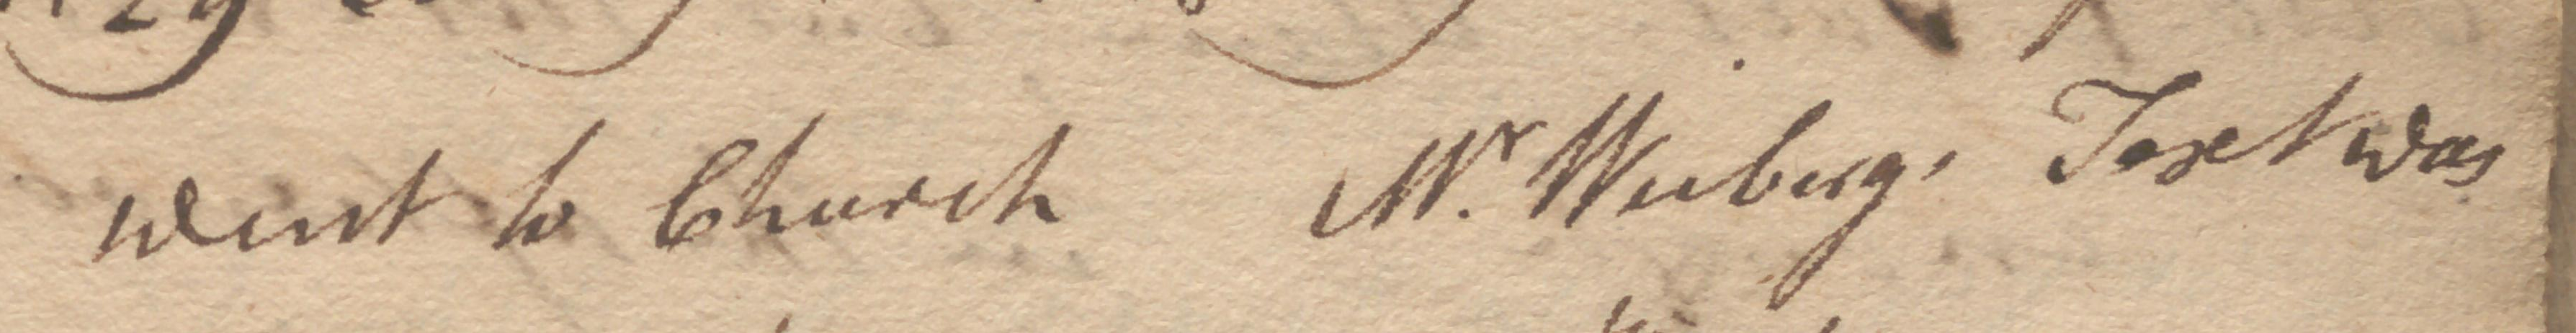went to Church M^r. Weibergs Text was
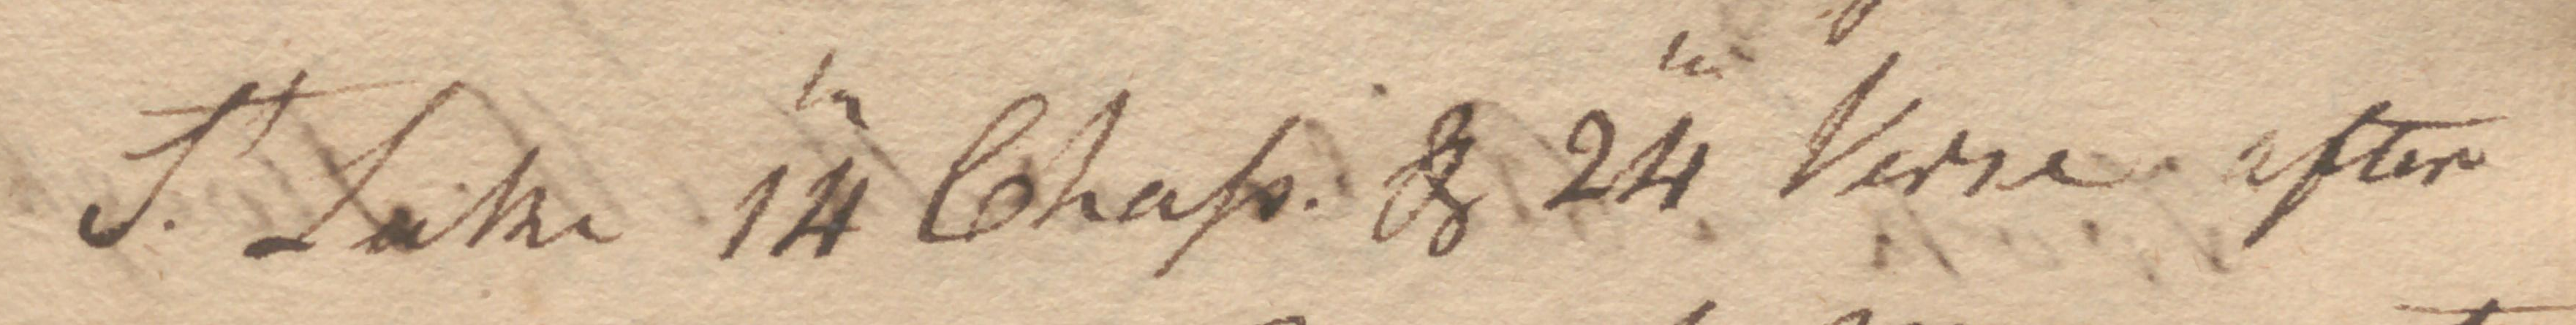S^t. Luke 14^th Chap. & 24^th Verse after
